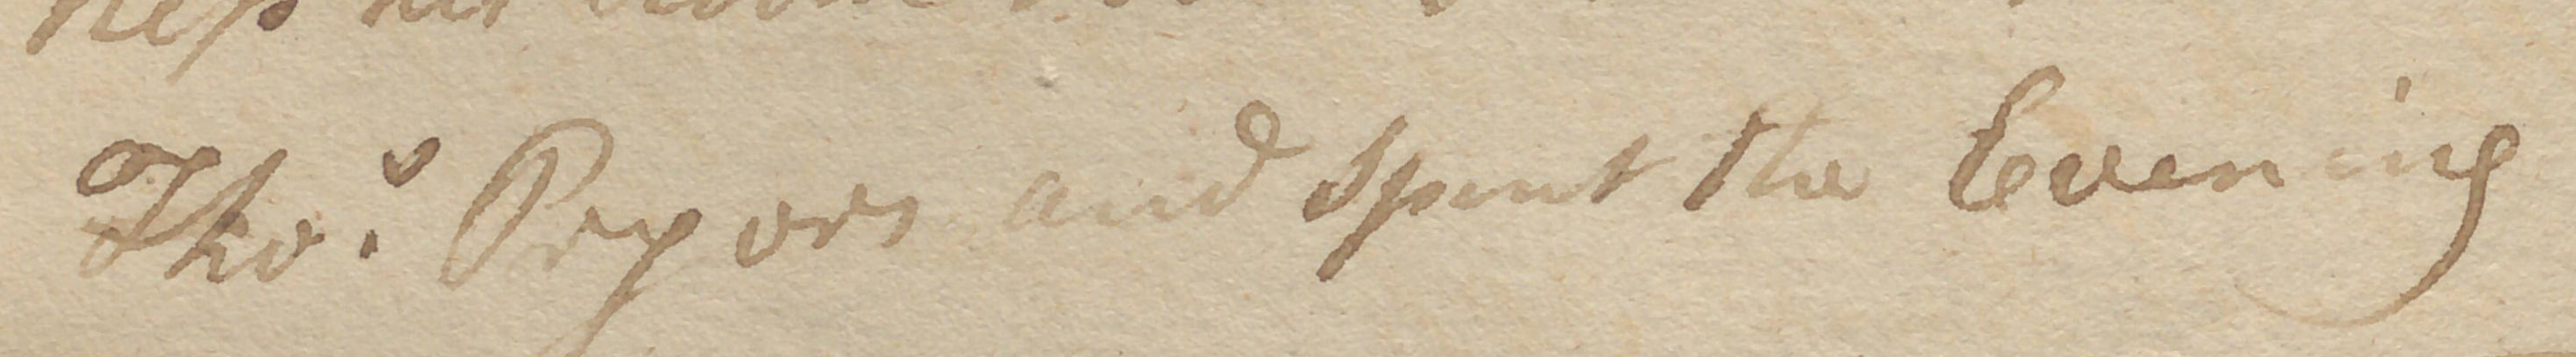Tho^s. Pryors and spent the Evening
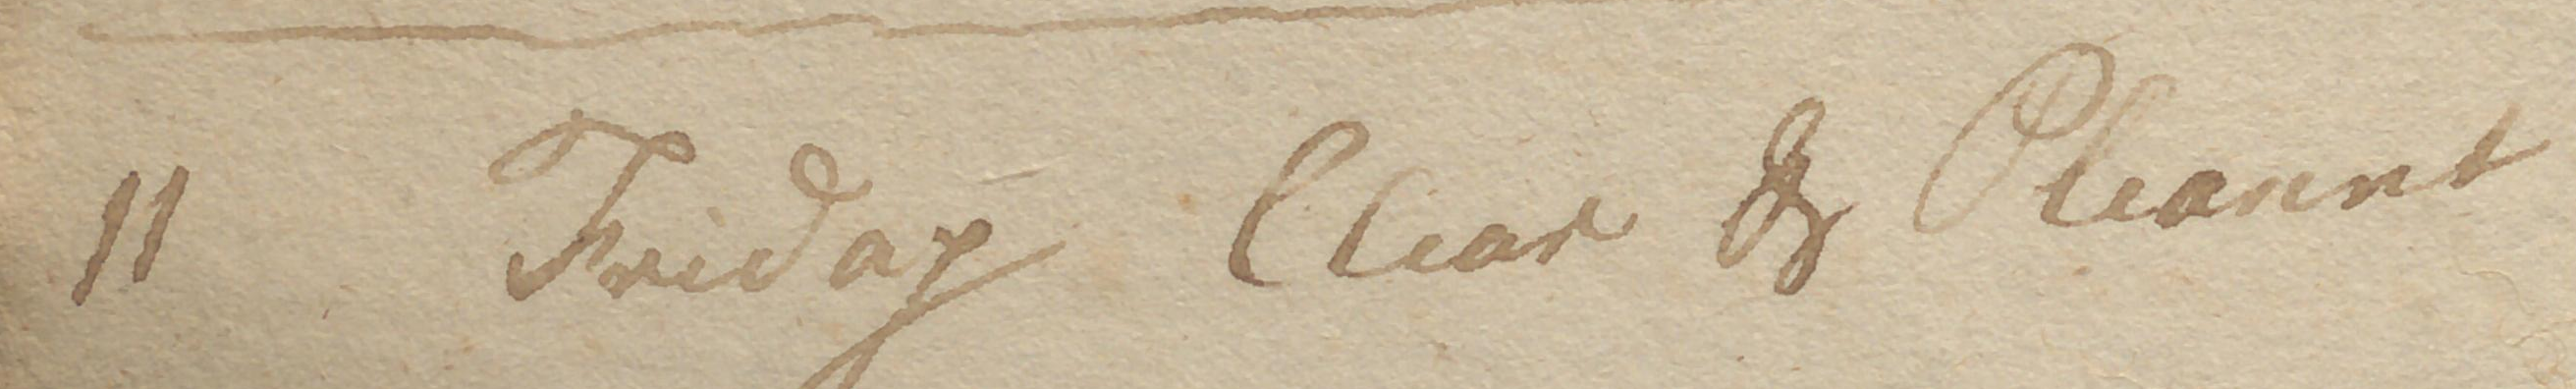11 Friday Clear & Pleasent
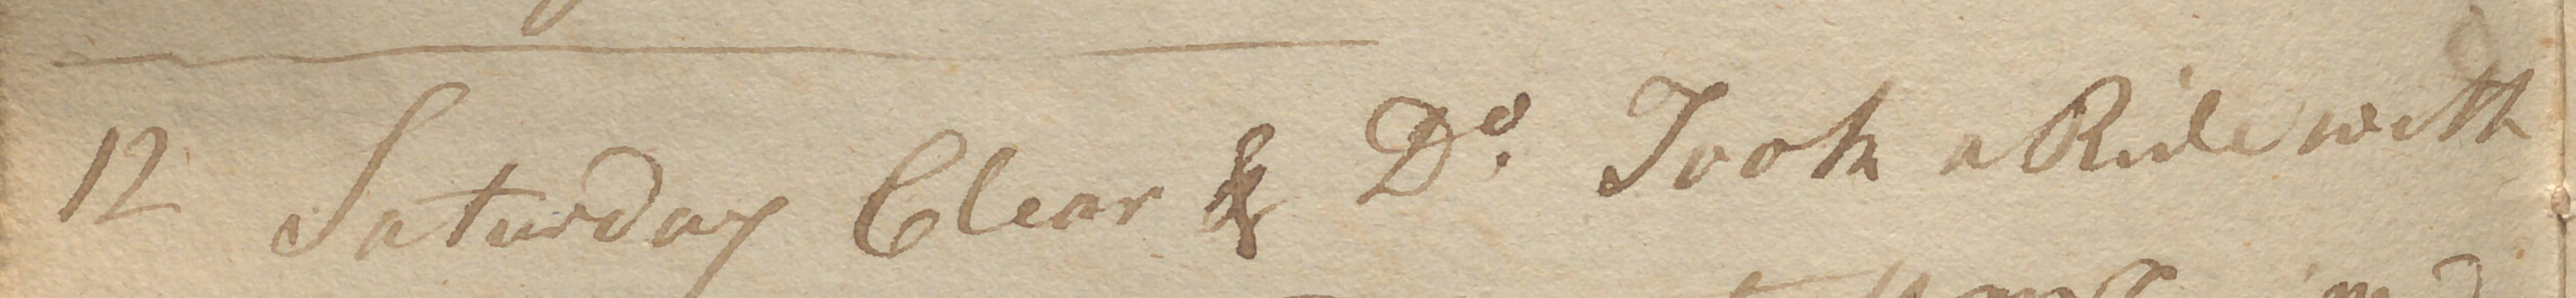12 Saturday Clear & D^o. Took a Ride with
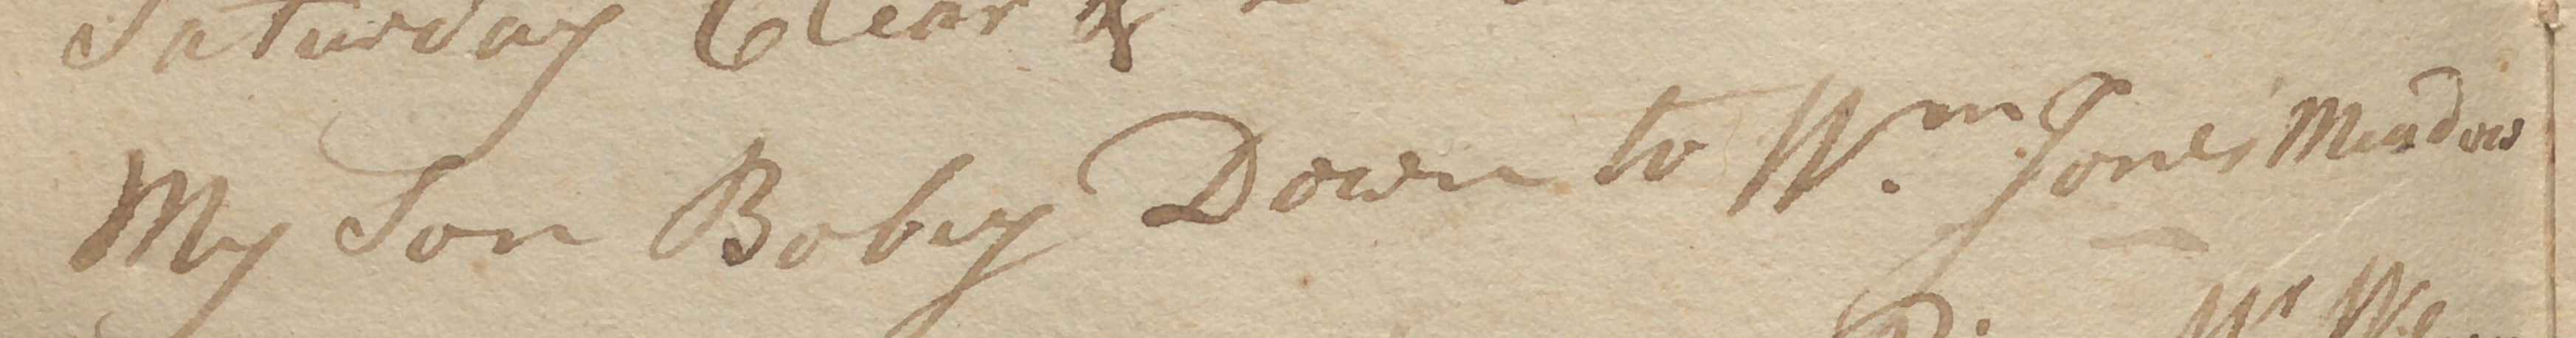My Son Bobey Down to W^m Jones Meadow
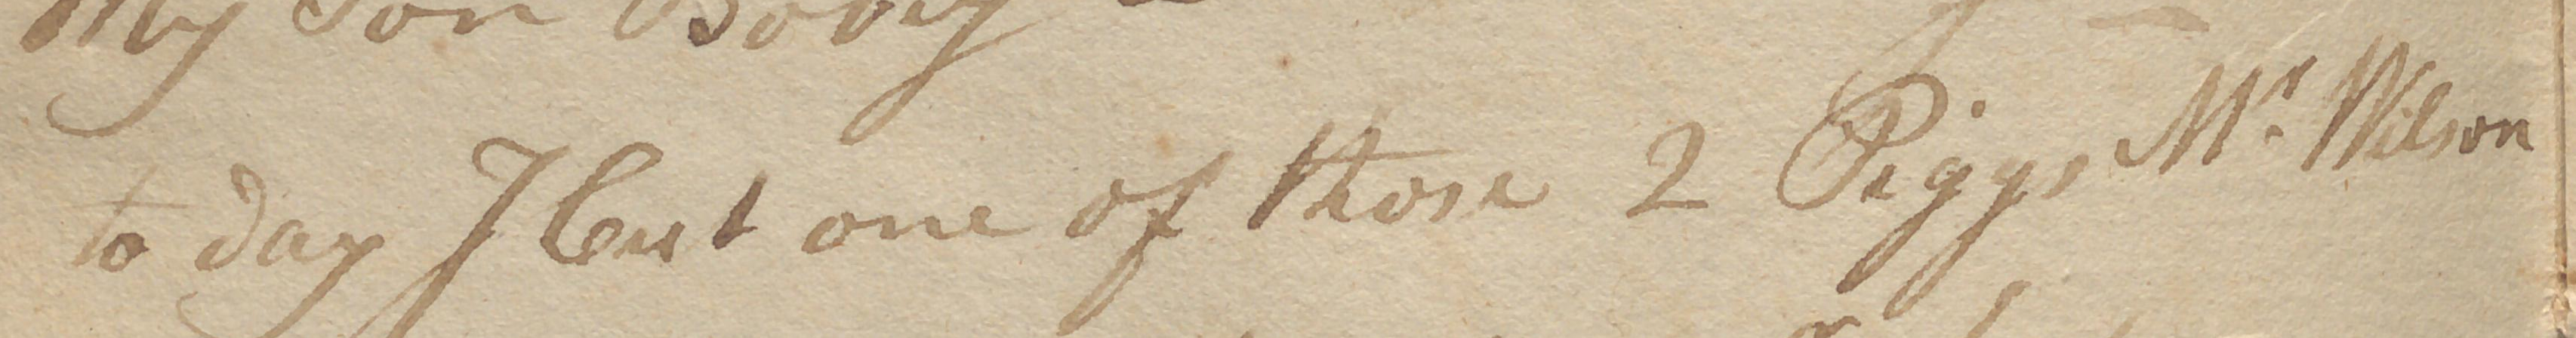to day I Cut one of those 2 Piggs M^r. Wilson
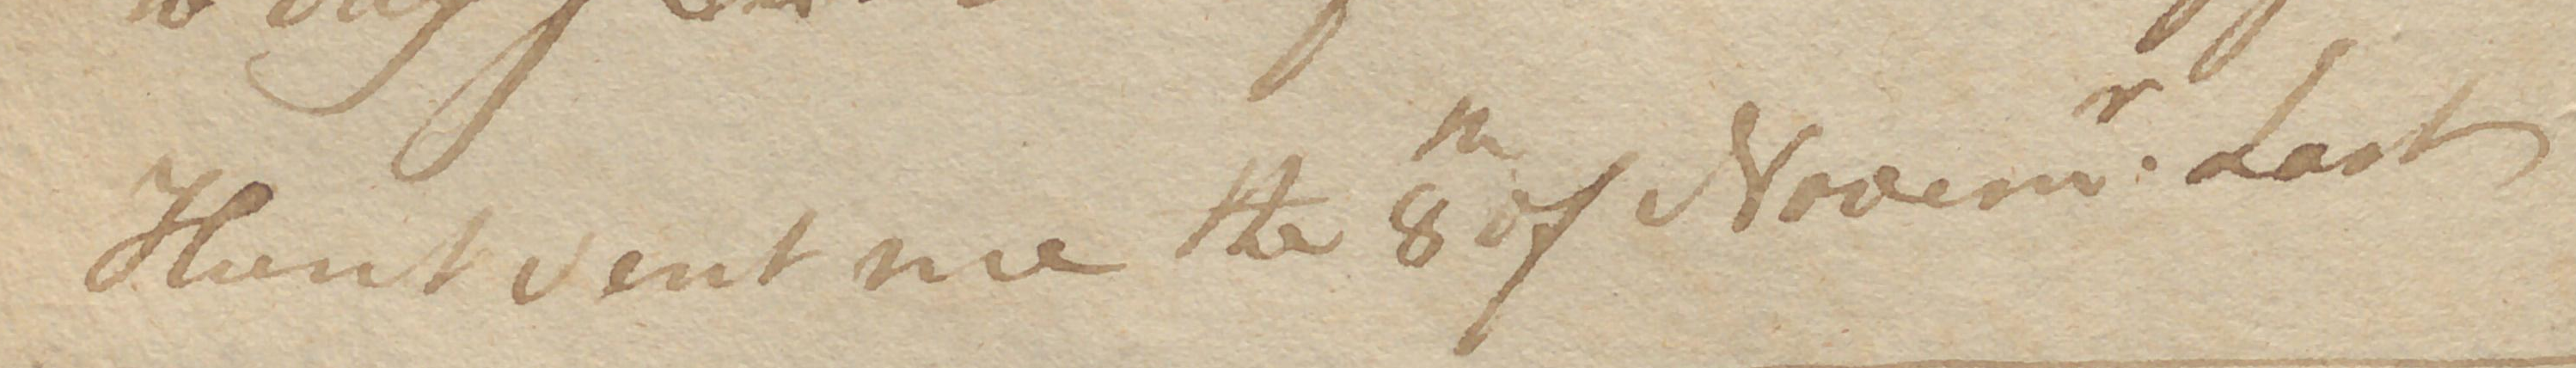Hunt sent me the 8^th of Novem^r. Last
